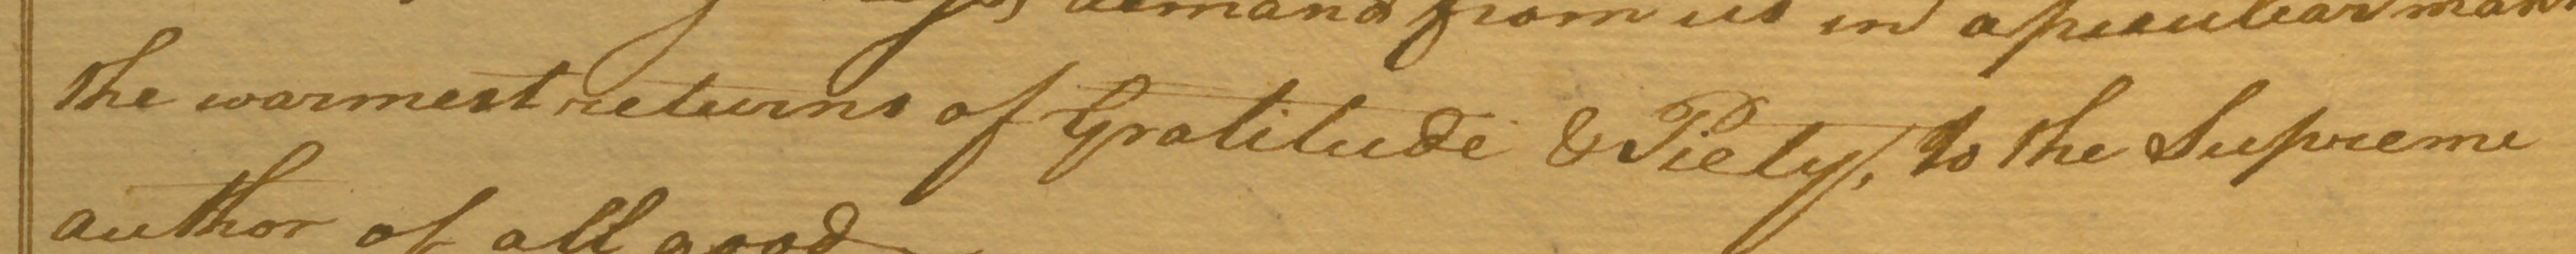the warmest returns of Gratitude & Piety, to the Supreme
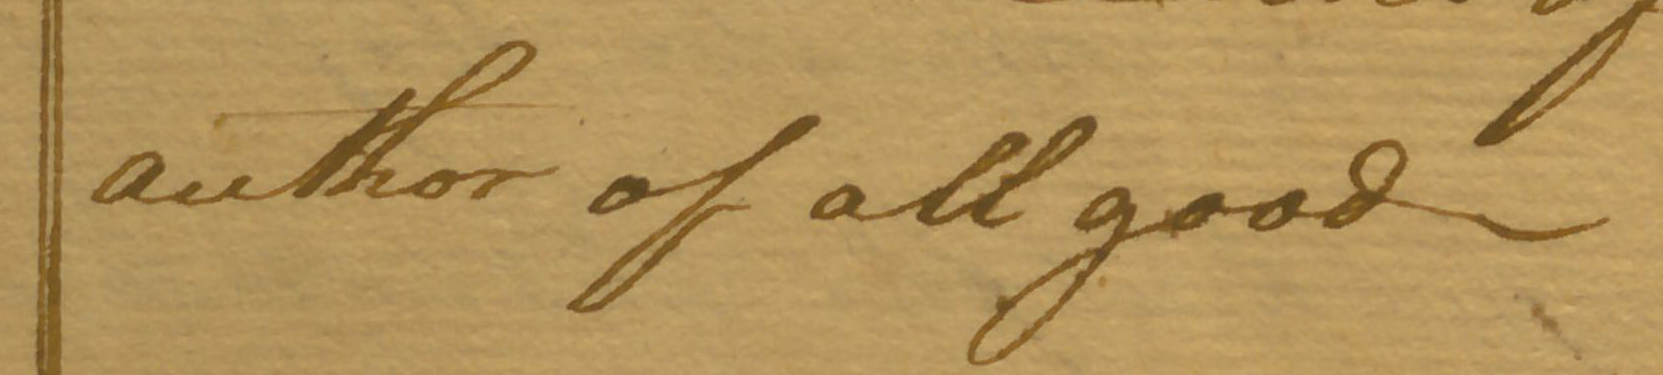author of all good-
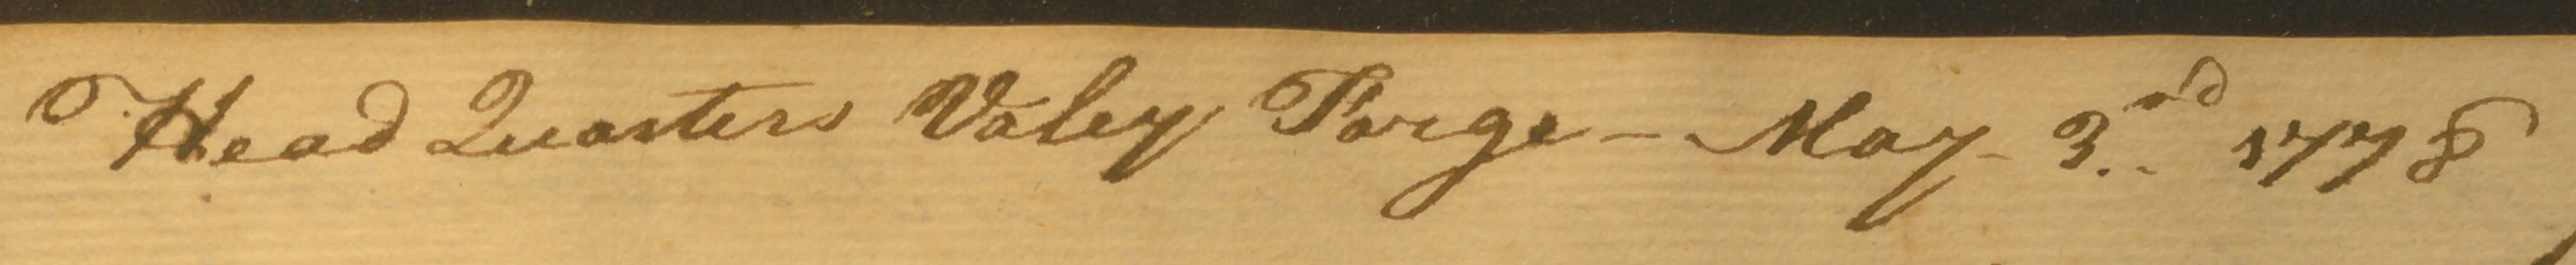Head Quarters Valey Forge- May 3^rd. 1778
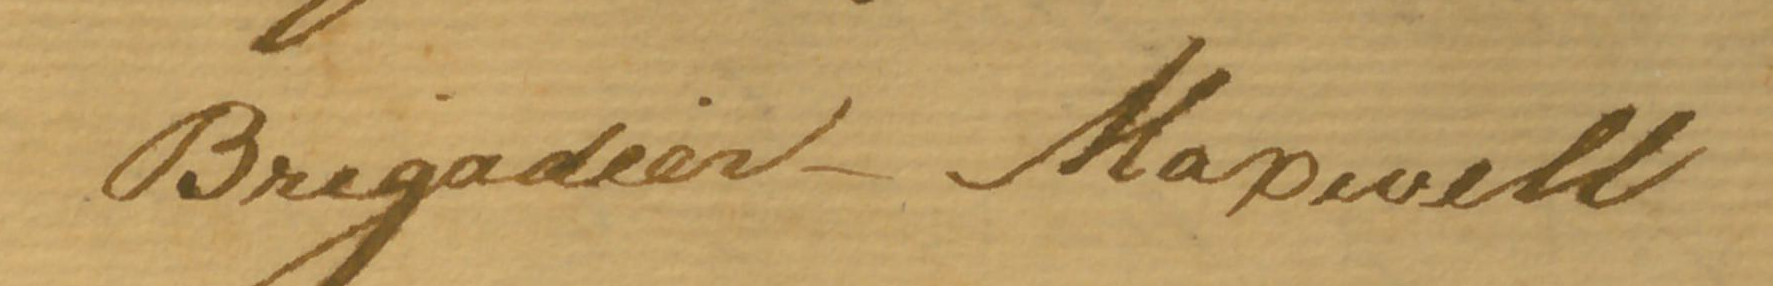Brigadier- Maxwell
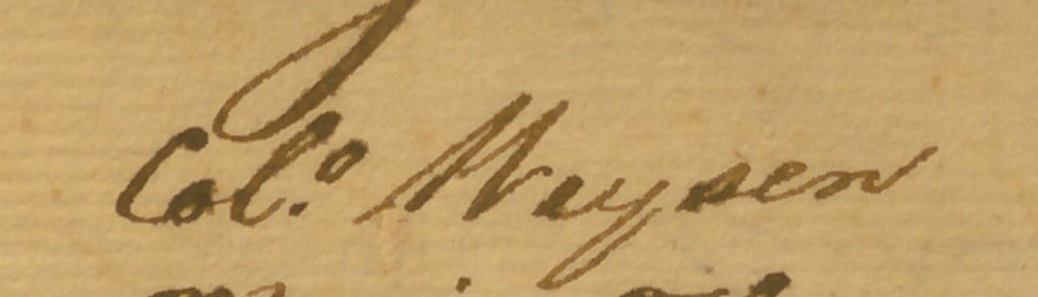Col^o. Weysen
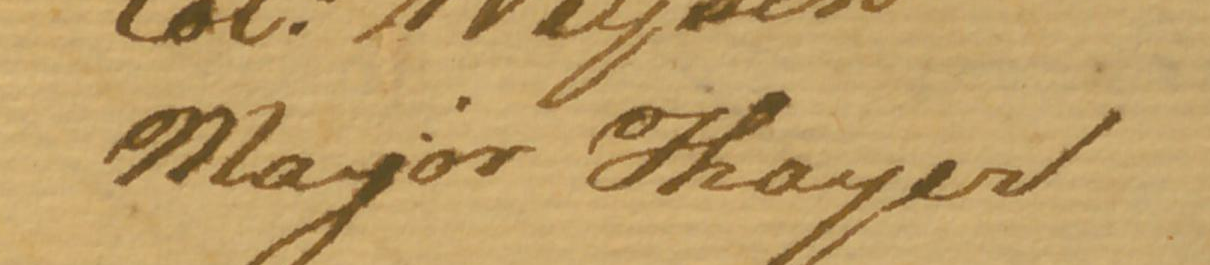Major Thayer
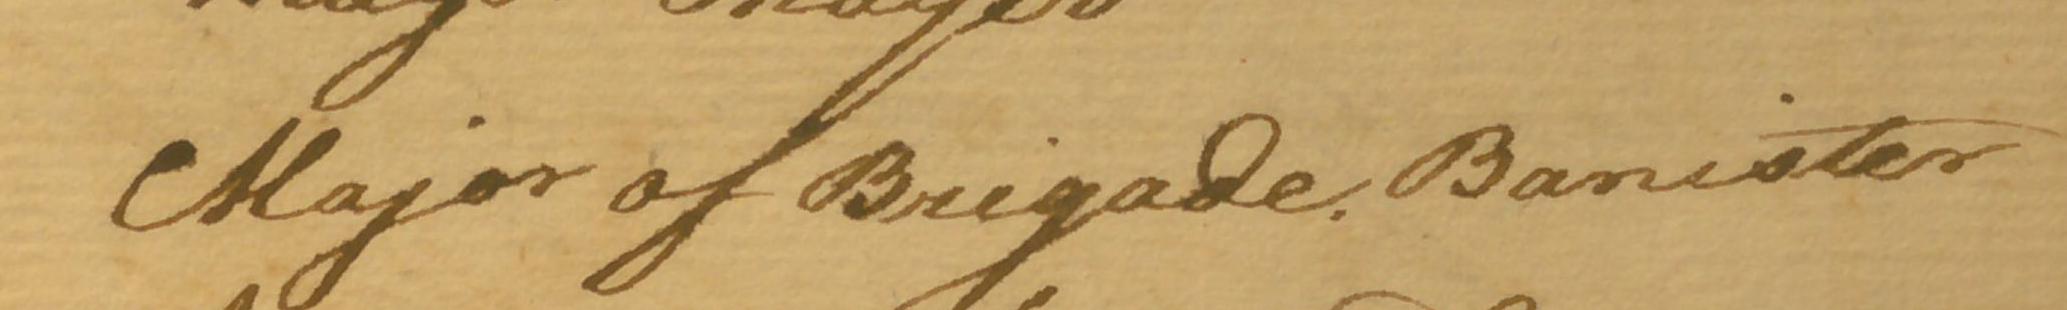Major of Brigade Banister
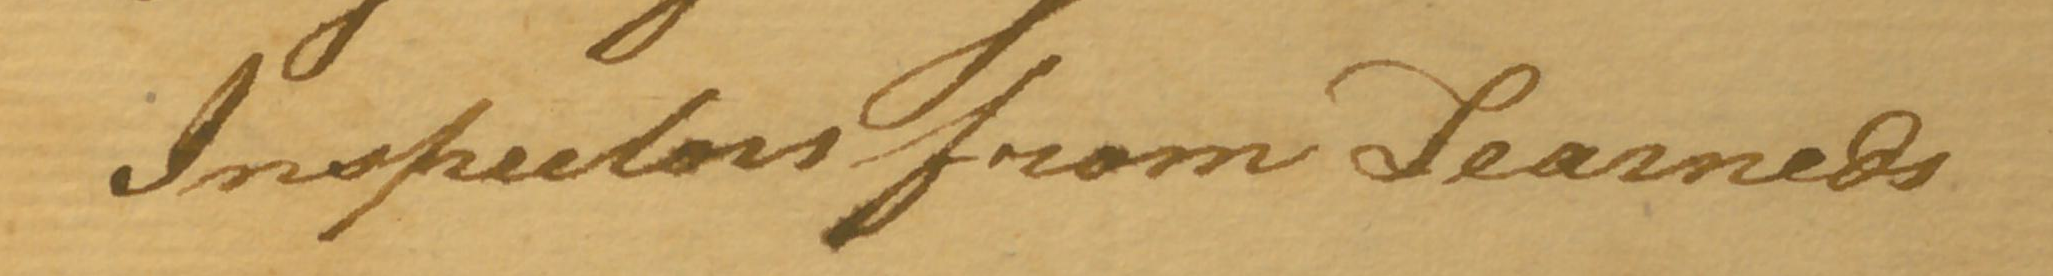Inspectors from Learneds
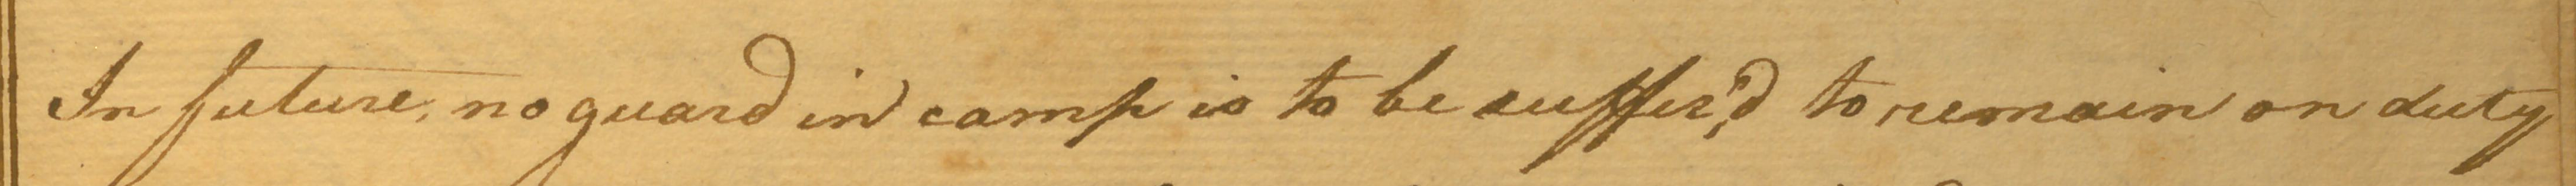In future, no guard in camp is to be suffer'd to remain on duty
